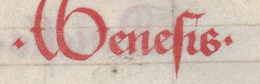.Geneſis.
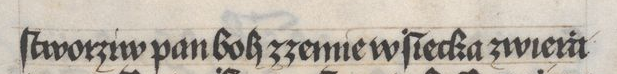ſtworziw pan boh z zemie wẛiecka zwieṙa¬
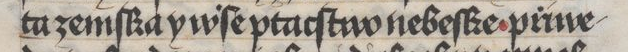ta zemſka y wẛe ptacſtwo nebeſke.pṙíwe¬
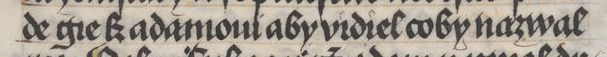de gie k adamoui aby vidiel coby nazwal
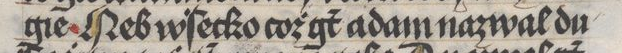gie.Neb wẛecko coż ḡt adam nazwal du¬
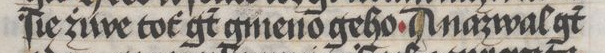ẛie żiwe toṫ ḡt gmeno geho.A nazwal ḡt
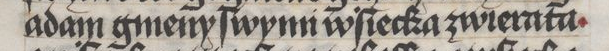adam gmeny ſwymi wẛiecka zwierata.
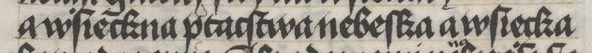a wẛieckna ptacſtwa nebeſka a wſiecka
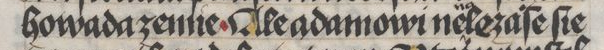howada zemie.Ale adamowí nenalezaẛe ſie
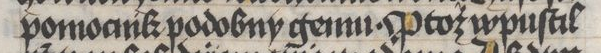pomocník podobny gemu. Ꝓtoż wpuſtil
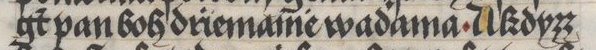ḡt pan boh dṙíemaníe w adama.A kdyzz
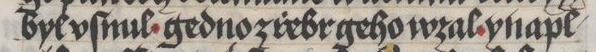byl vſnul.gedno z ṙebr geho wzal.y napl¬
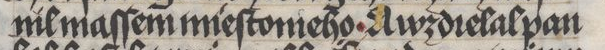nil maſſem míeſtonieho.A wzdielal pan
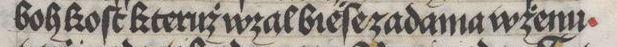boh koſt kteruż wzal bieẛe zadama w żenu.
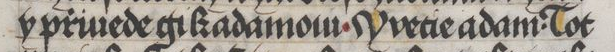y pṙiuede gi k adamoui.Y vecie adam.Tot
